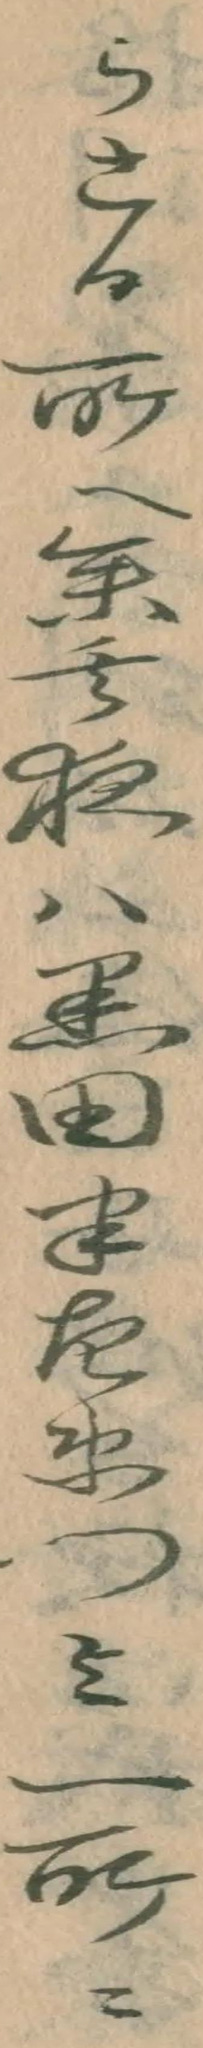らさる所へ参其夜は黒田半左衛門与一所に
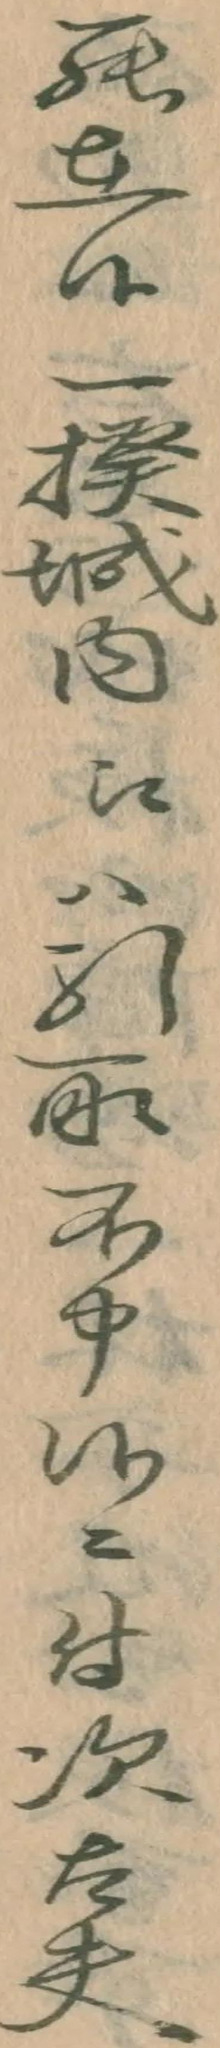罷在候一揆城内江は引取不申候に付次太夫
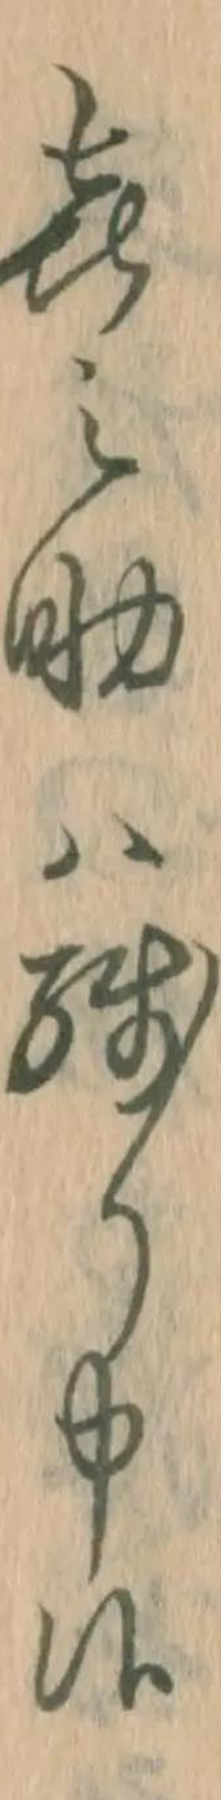喜之助は残り申候
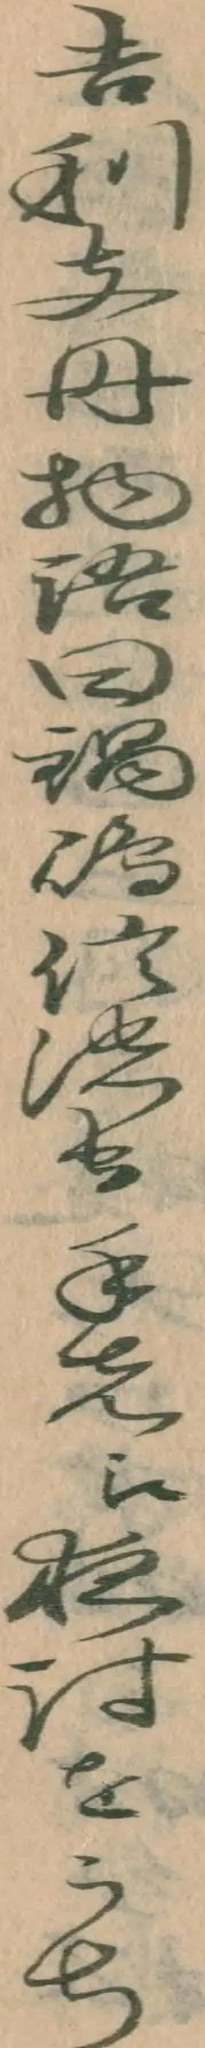吉利支丹物語曰鍋島信濃守手先江夜討をうち
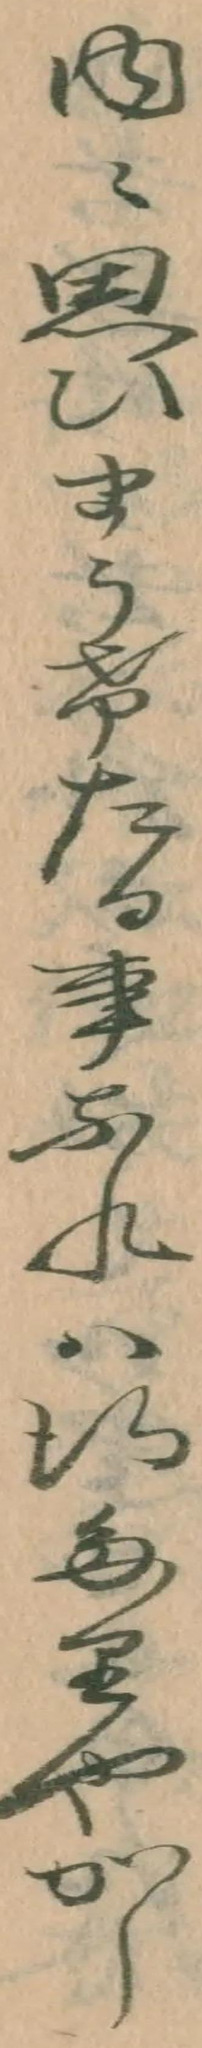内に思ひまう希たる事なれは得多里や加し
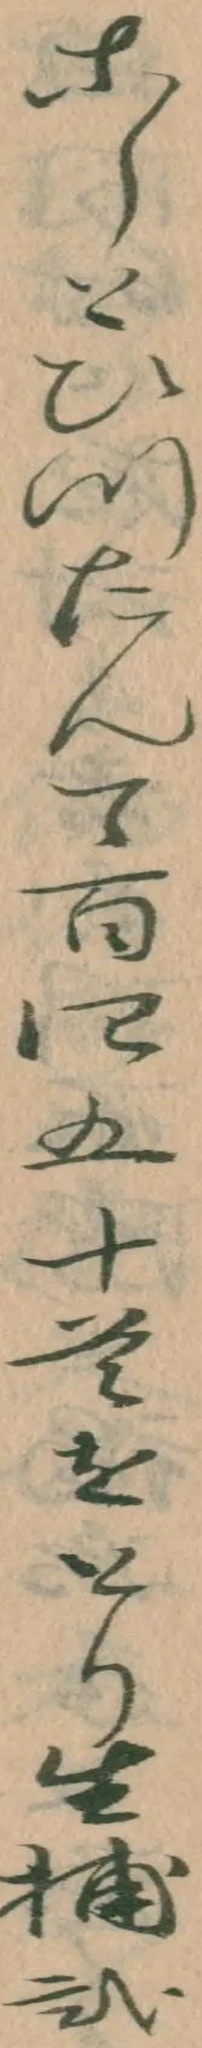古しとひ川たんて百四五十首をとり生捕弐
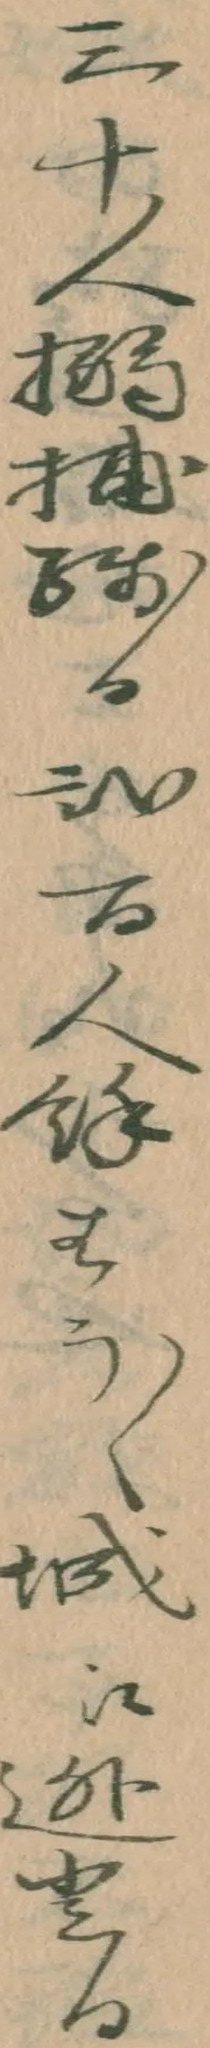三十人搦捕残る弐百人余はう〱城江逃登る
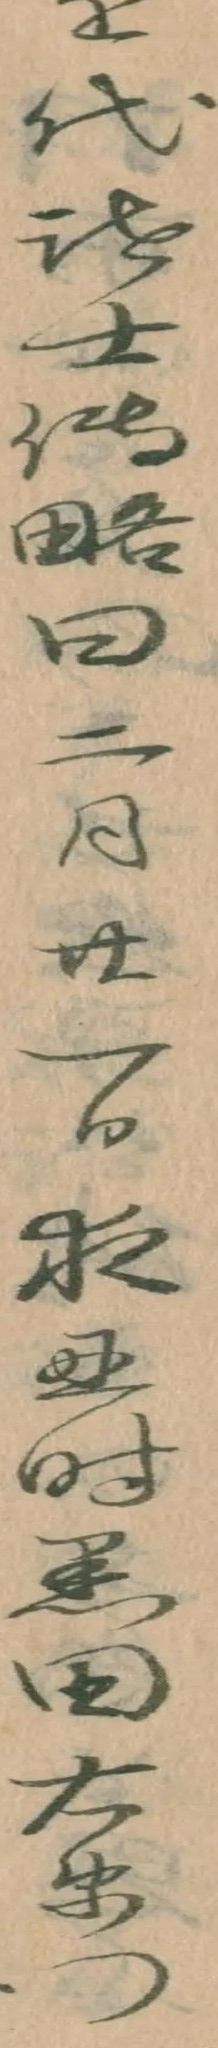近代諸士伝略曰二月廿一日夜丑時黒田右衛門
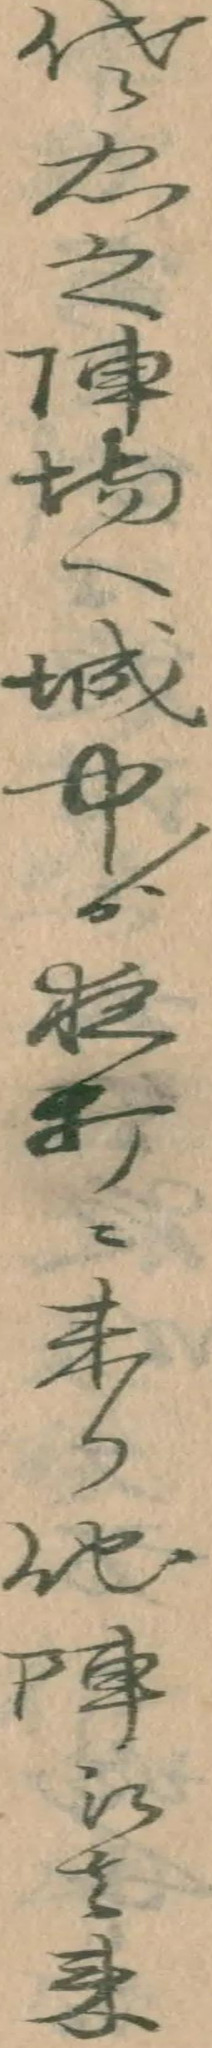佐忠郷陣場へ城中ゟ夜打に来り他陣江者来
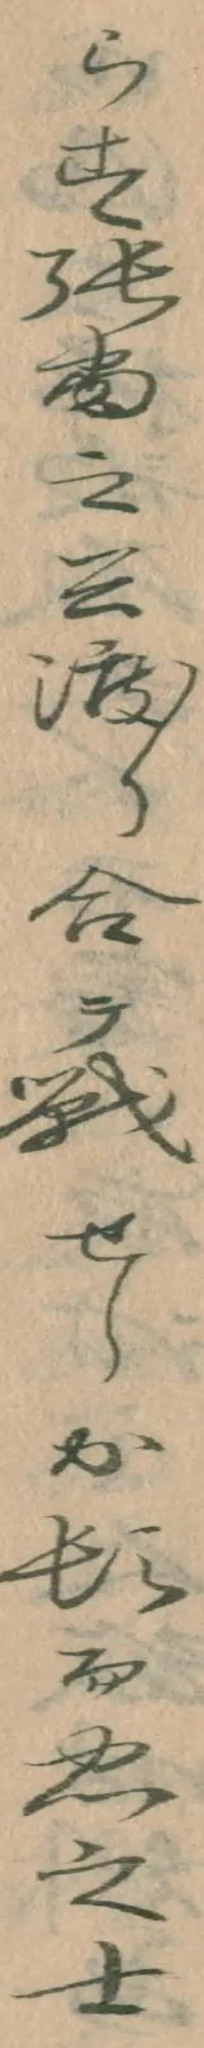ら春張番之三渡り合て戦せしか頓而忠郷士
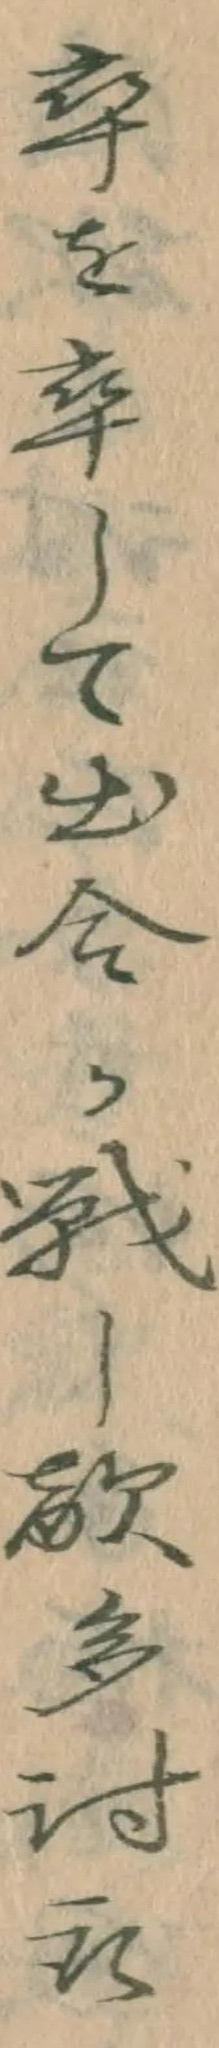卒を卒して出合か戦し敵多討取
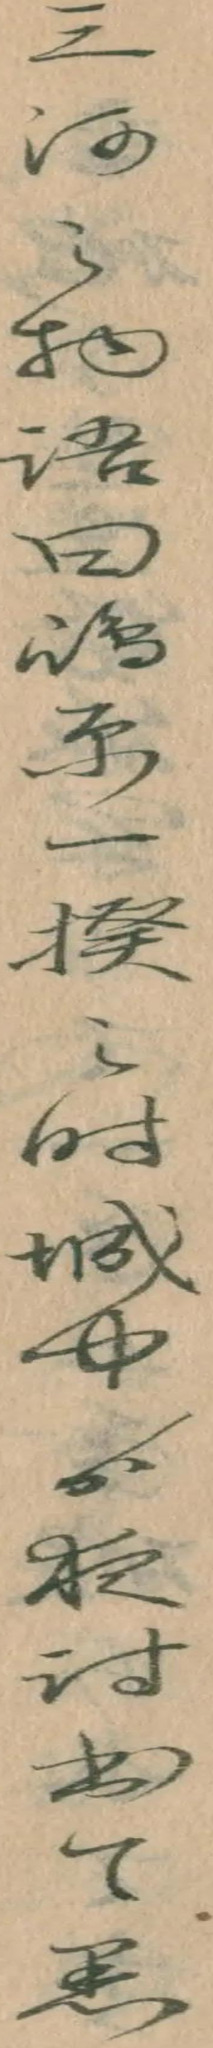三河之物語曰島原一揆之時城中ゟ夜討出て黒
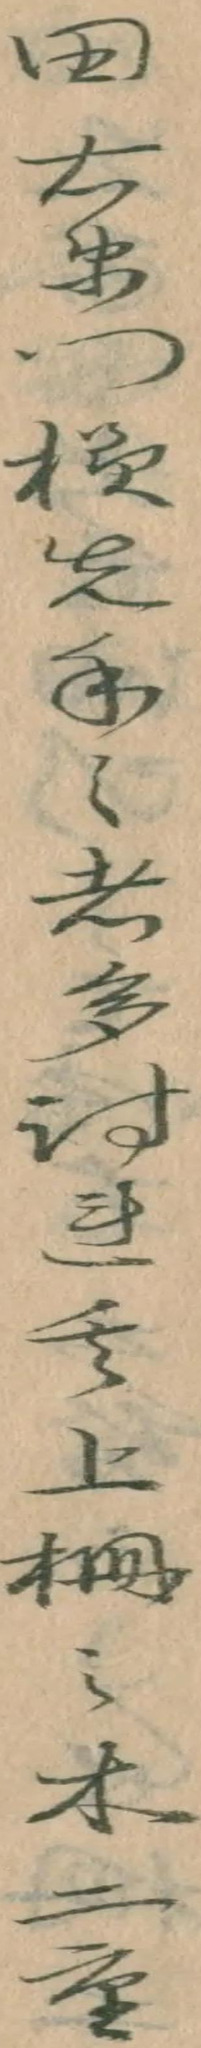田右衛門様先手之者多討連其上柵之木二重
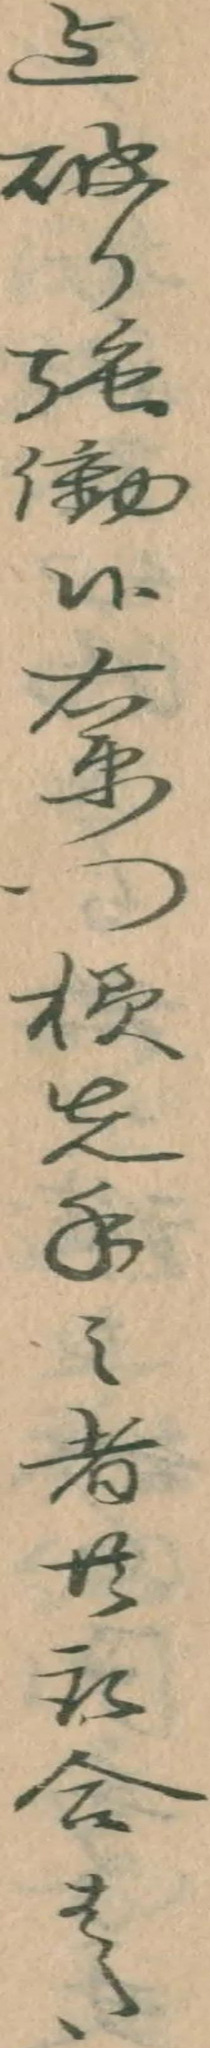迄破り強働候右衛門様先手之者共取合はた
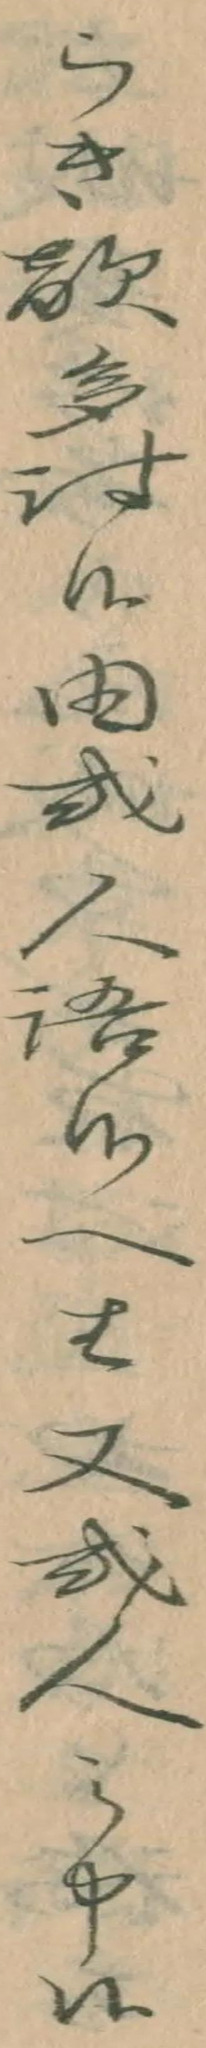らき敵多討候由或人語候へ者又或人之申候

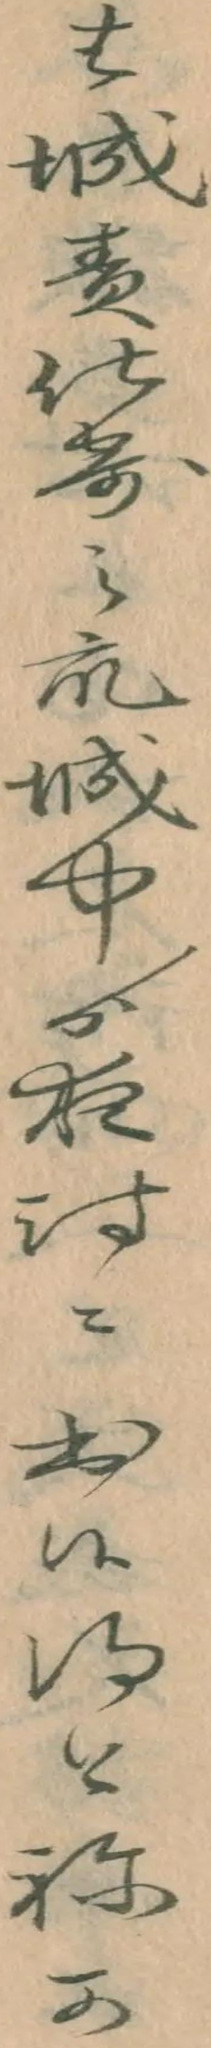者城責仕寄之衆城中ゟ夜討に出候得と祢可
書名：切支丹御退治記 49巻. [7]
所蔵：国立国会図書館 National Diet Library, JAPAN
